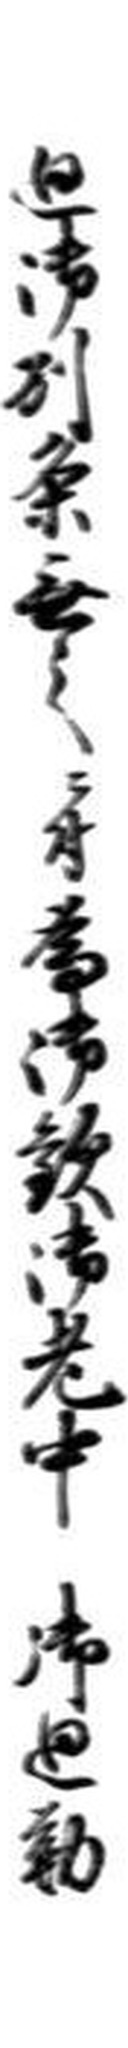廻御別条無之ニ付為御歓御老中御廻勤
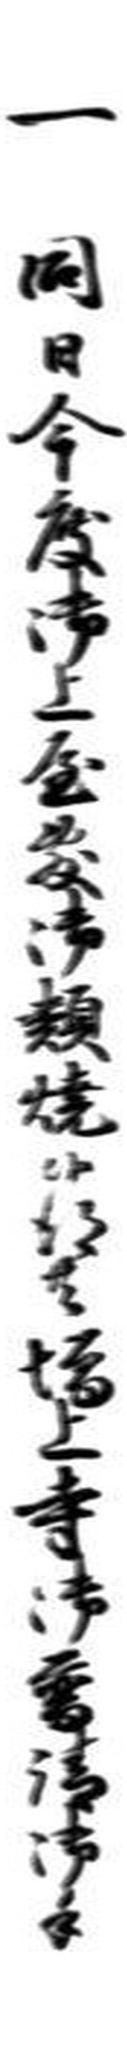一同日今度御上屋敷御類焼候得共増上寺御普請御手

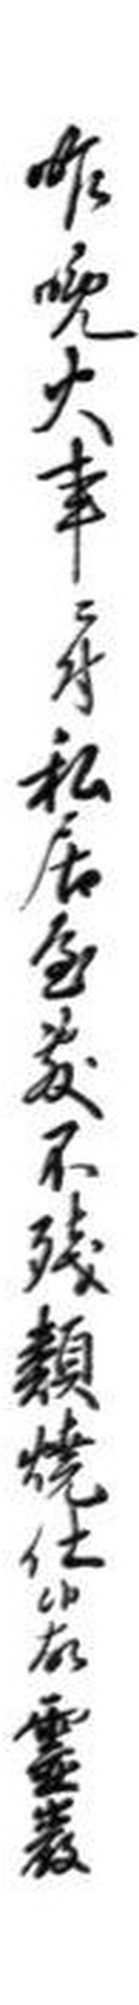昨晩火事ニ付私居屋敷不残類焼仕候故霊厳
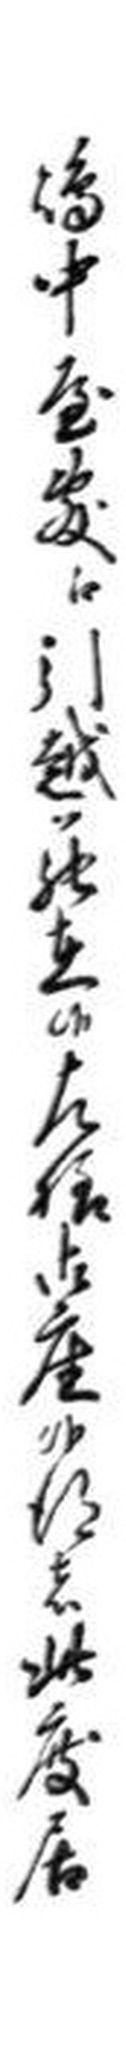嶋中屋敷江引越罷在候左様御座候得者此度居
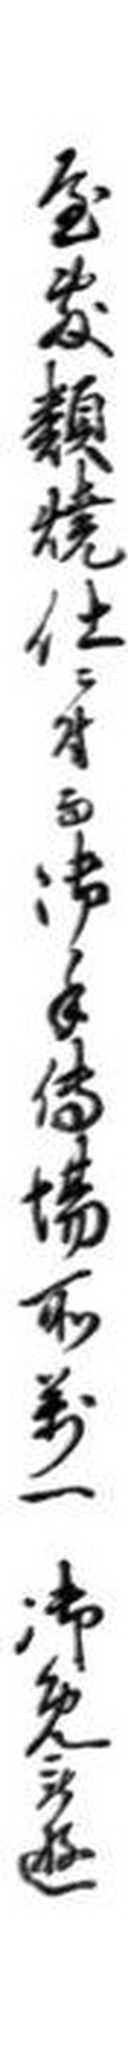屋敷類焼仕ニ付而御手伝場所万一御免被遊
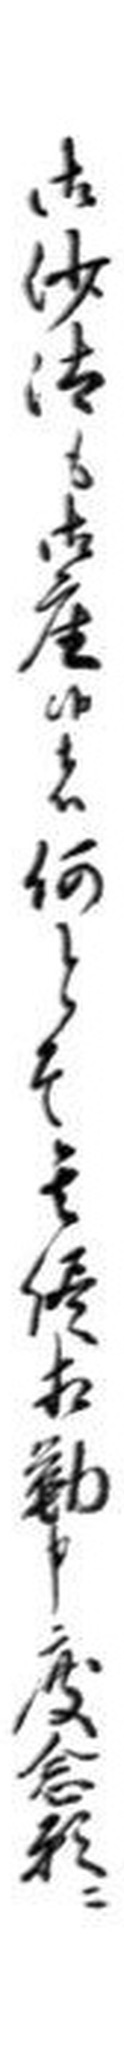御沙汰も御座候者何とそ其儘相勤申度念願ニ
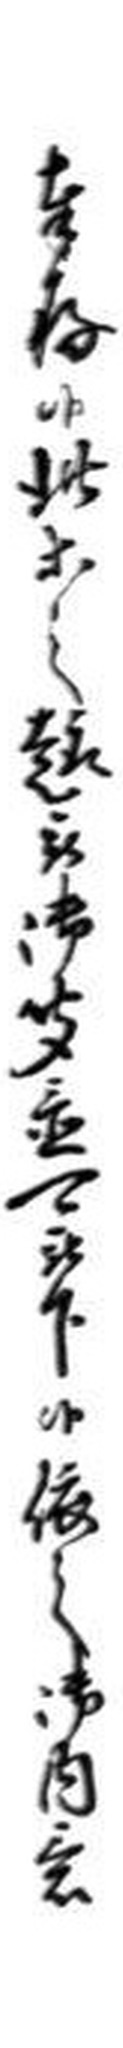奉存候此等之趣被御聞置可被下候依之御内意
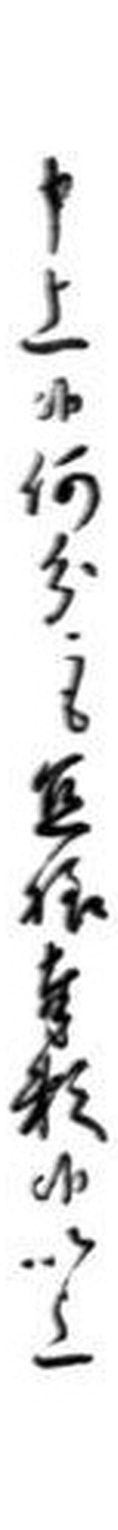申上候何分ニも宜様奉頼候以上
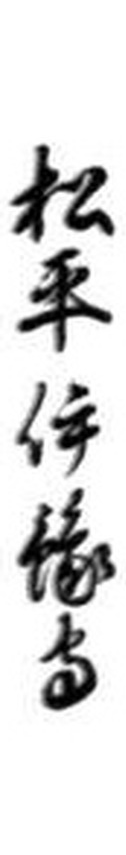松平伊予守
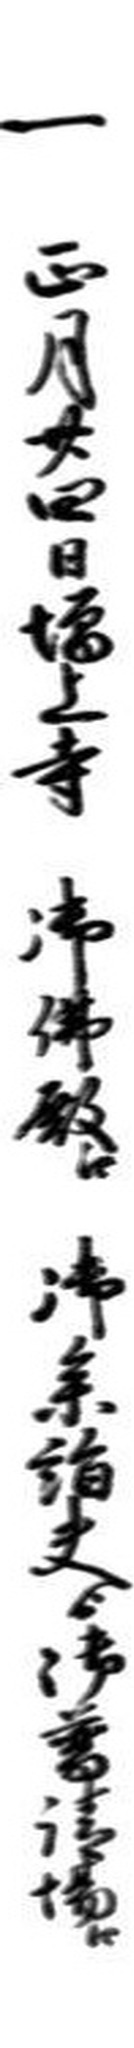一正月廿四日増上寺御仏殿江御参詣夫ゟ御普請場江
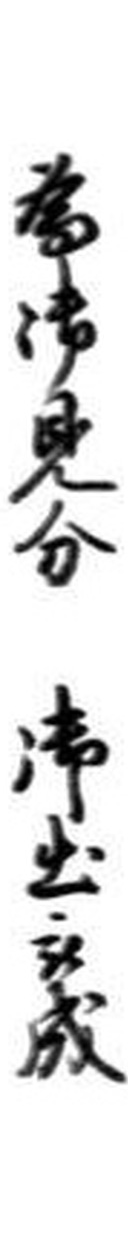為御見分御出被成
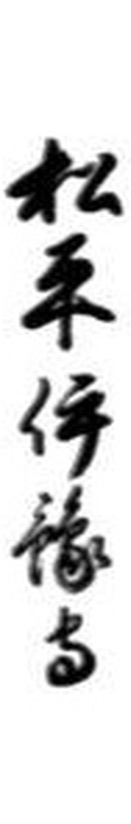松平伊予守
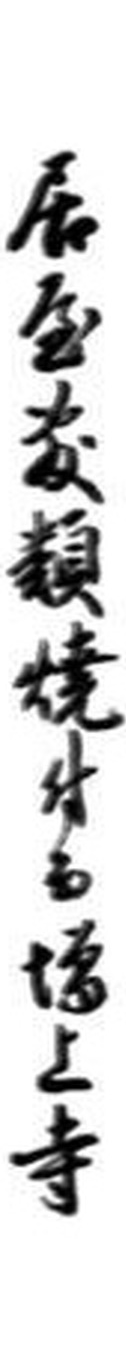居屋敷類焼付而増上寺
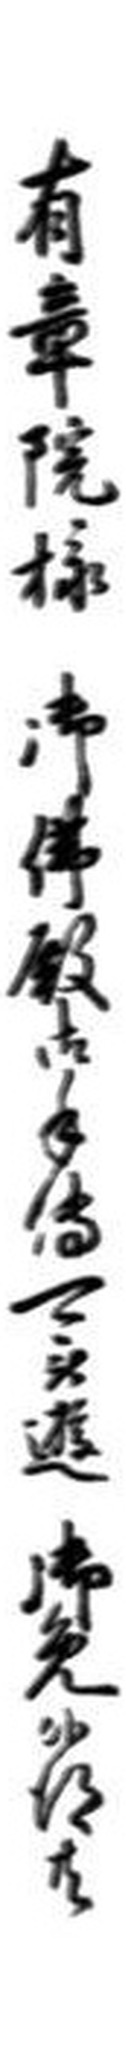有章院様御仏殿御手伝可被遊御免候得共

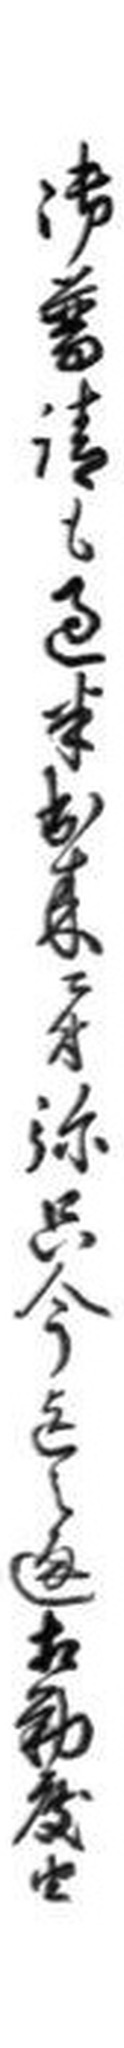御普請も過半出来ニ付弥只今迄之通相勤度由
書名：家譜 三十二 吉邦公 従享保二年到享保三年
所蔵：福井県文書館 Fukui Prefectural Archives
